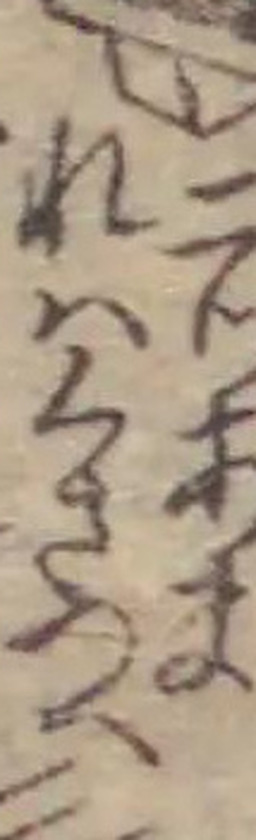れはくさつへ
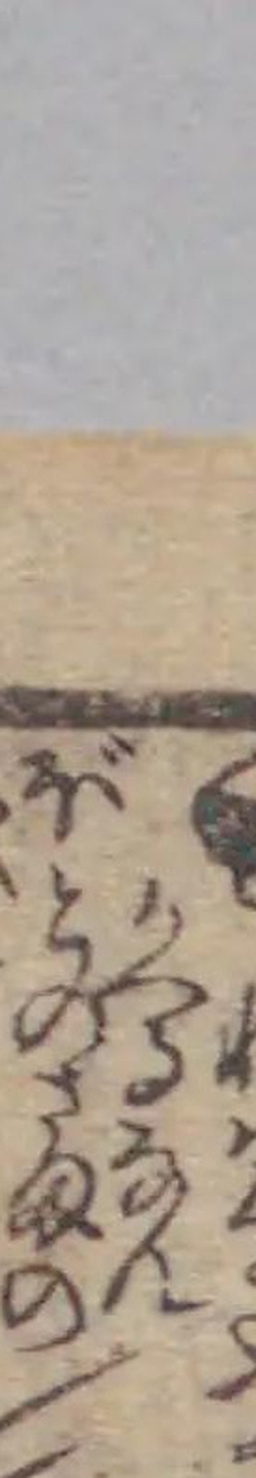ぼとのさまの
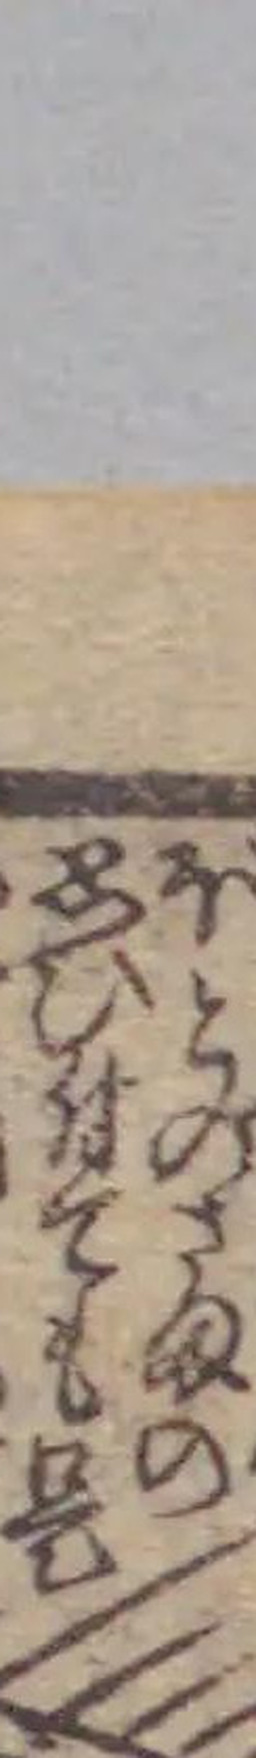思ひ付ても是
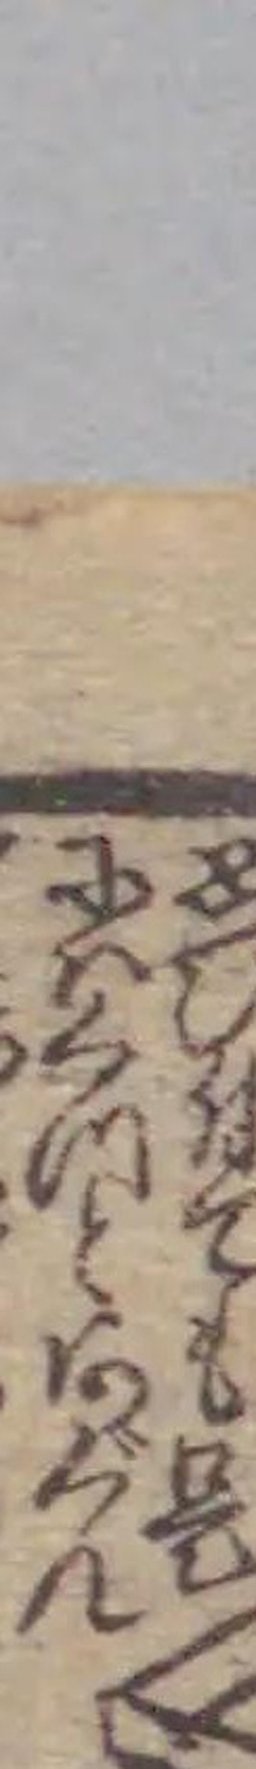にはくつとあぐん
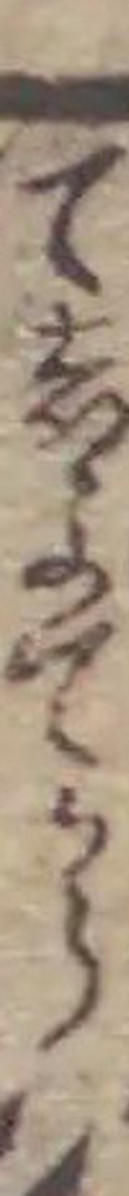てしよてから
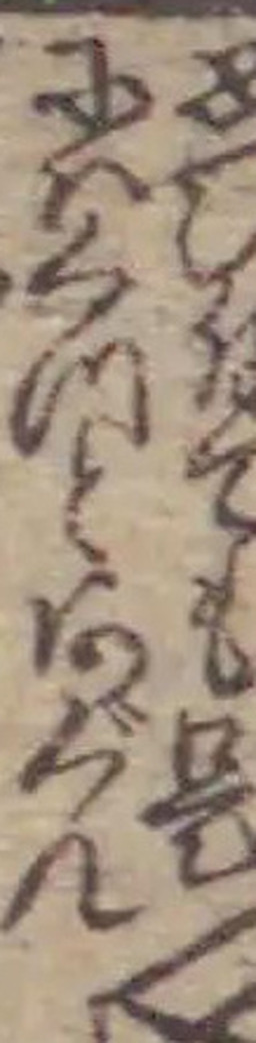にはくつとあぐん
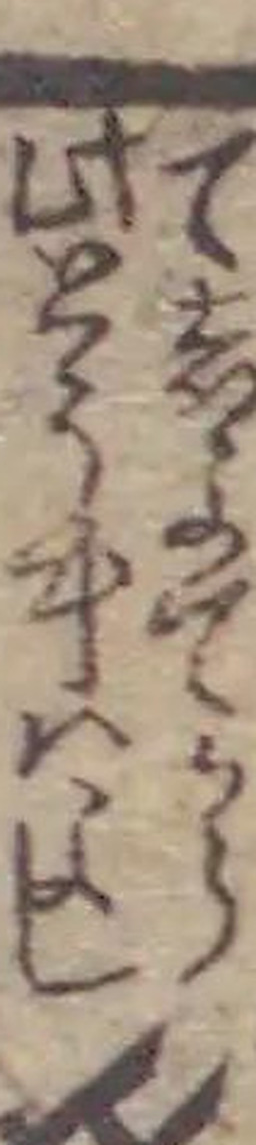此とう中はよし
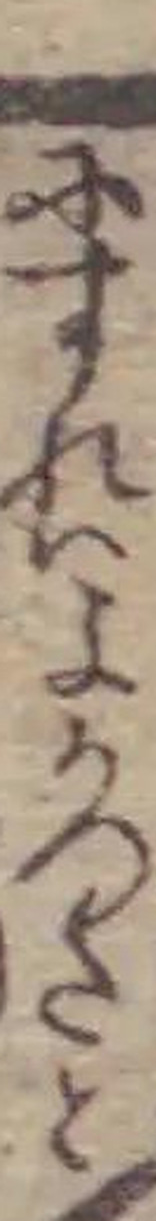にすれはよかつたと
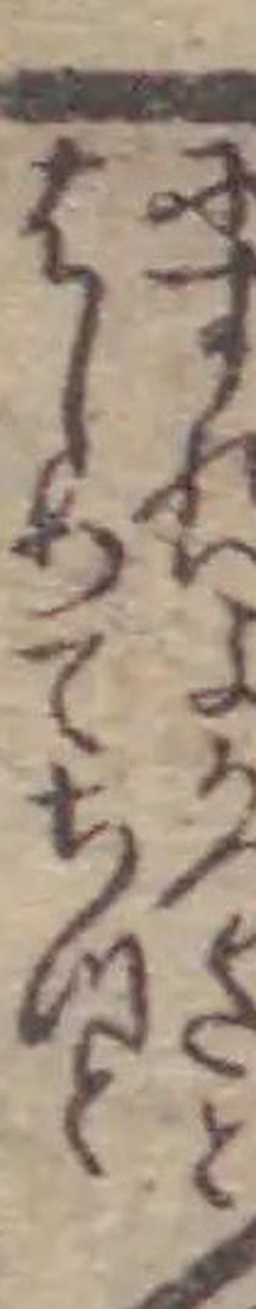はしめてちつと
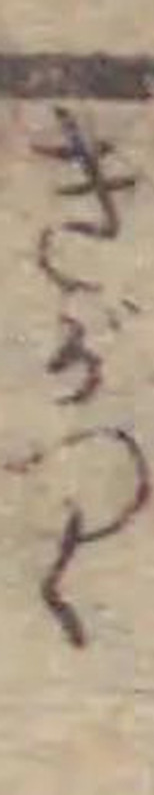きがつく

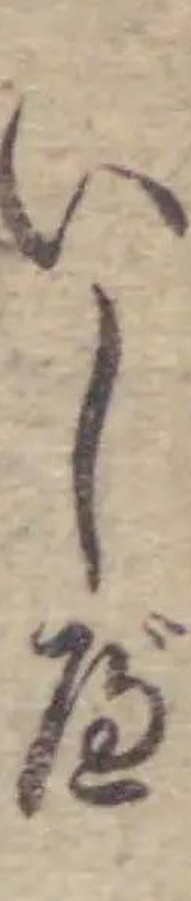いしべ
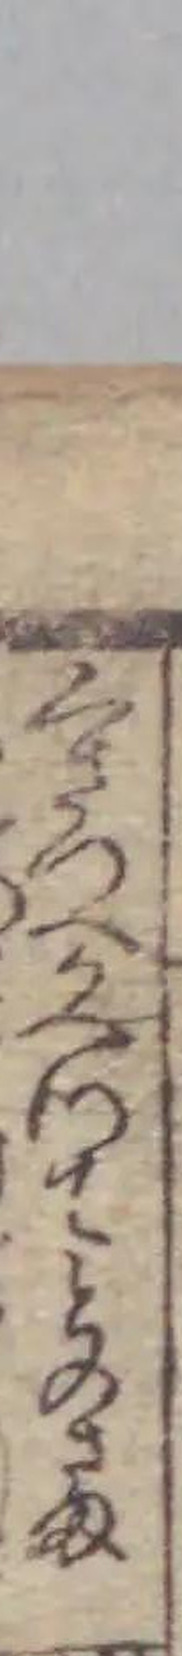くさつへかへつてとのさま
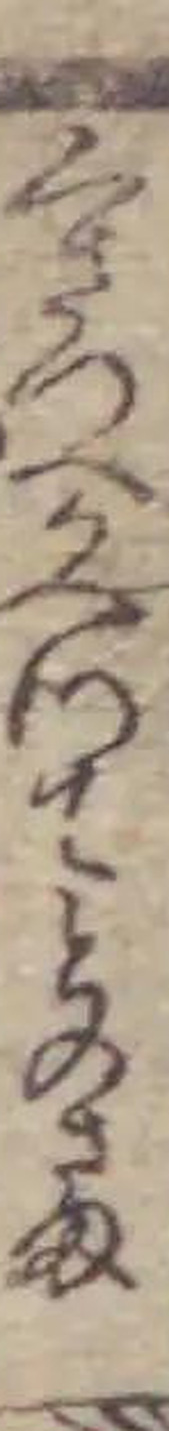くさつへかへつてとのさま
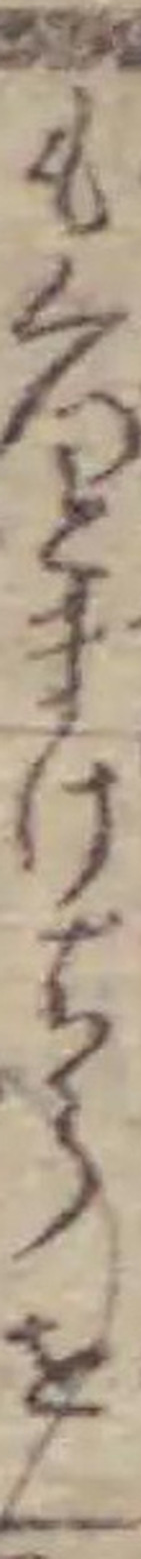もくつとまけはらを
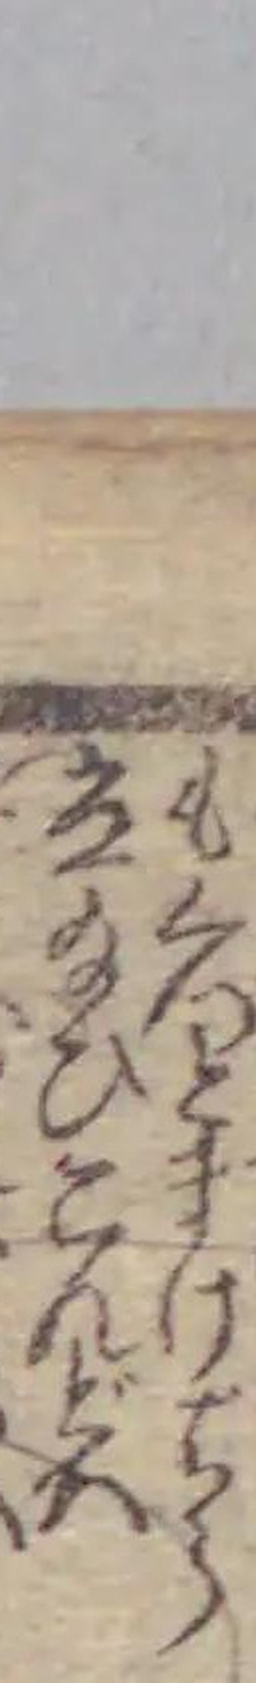立給ひこんどは
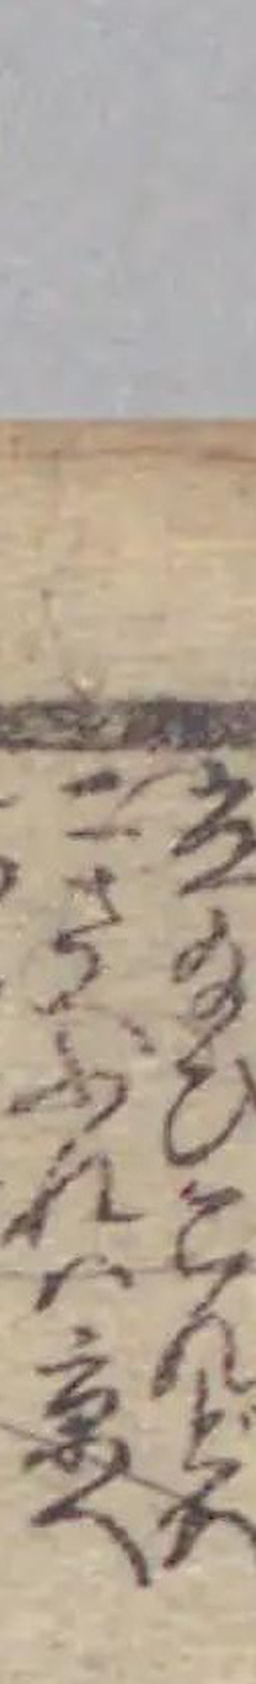二さへふれは京へ
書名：道笑双六
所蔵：国立国会図書館 National Diet Library, JAPAN
